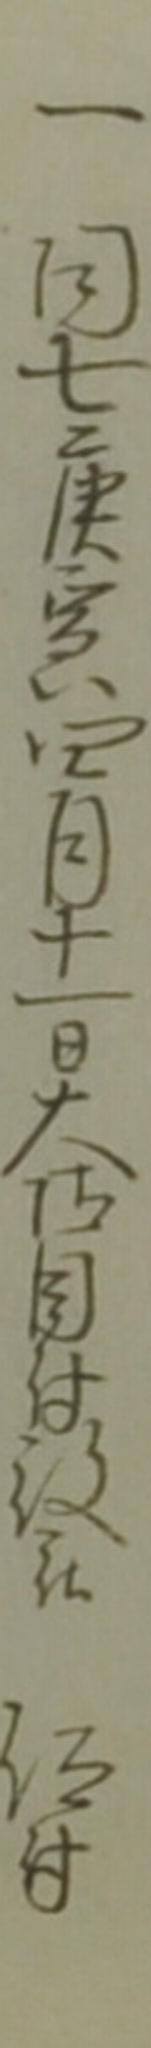一同七庚寅四月十一日大御目付役被仰付
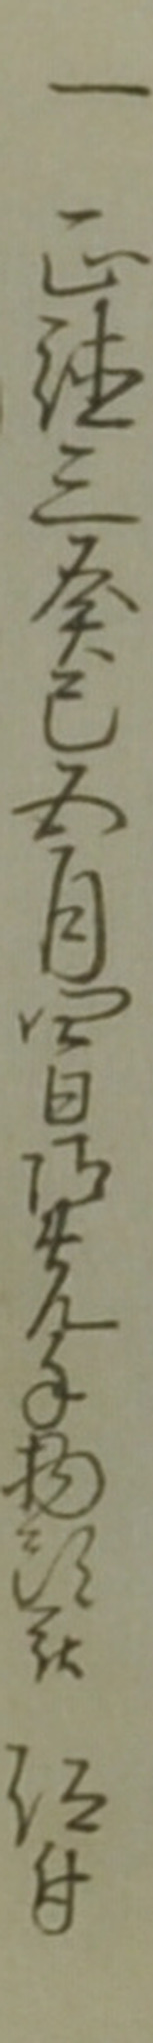一正徳三癸巳五月四日御先手物頭被仰付
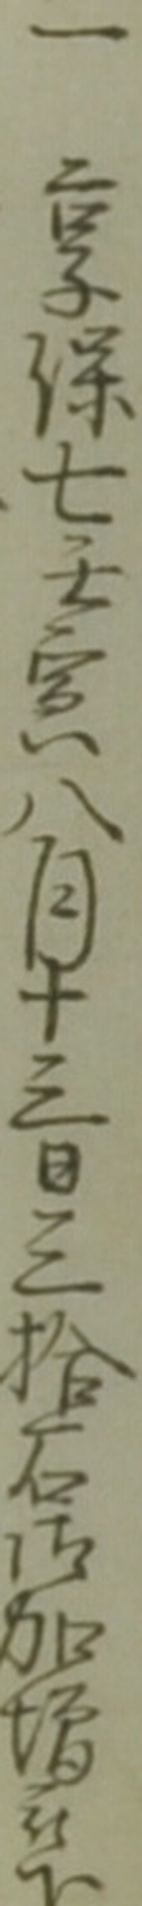一享保七壬寅八月十三日三拾石御加増被下
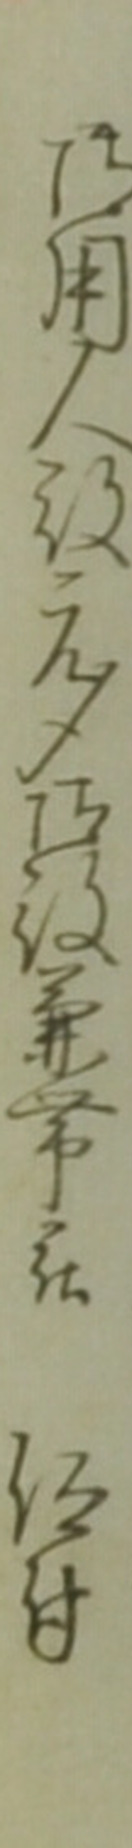御用人役元〆御役兼帯被仰付
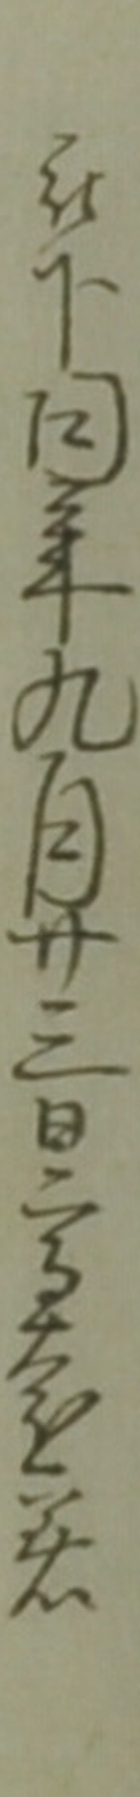被下同年九月廿三日高遠着

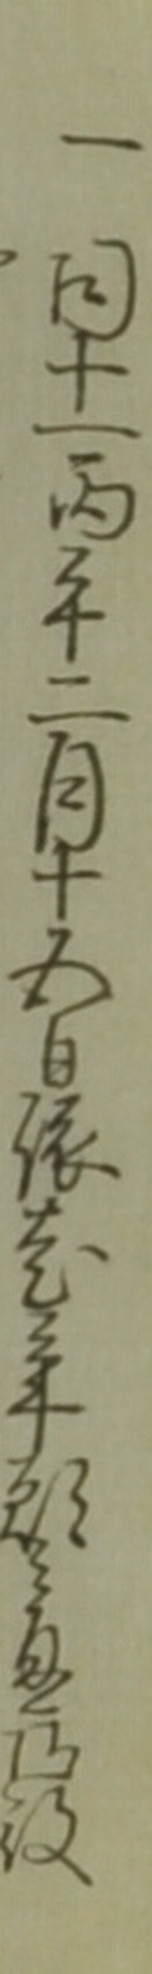一同十一丙午二月十五日依老年願之通御役
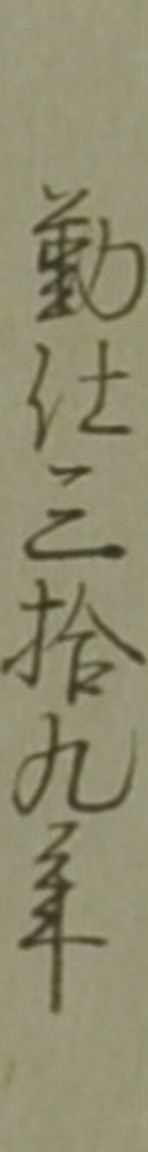勤仕三拾九年
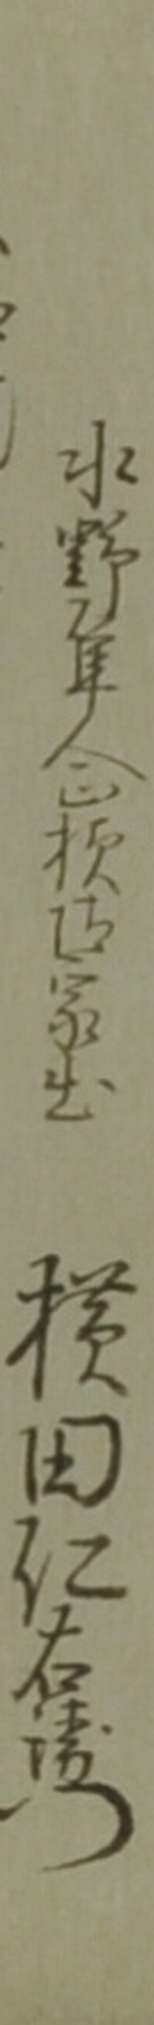水野隼人正様御家出横田仁右衛門
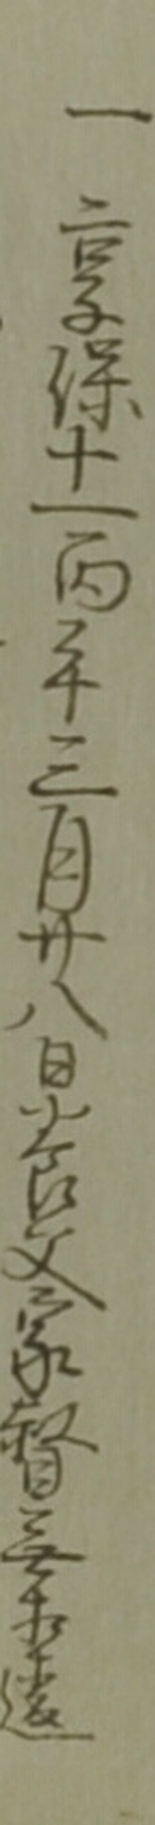一享保十一丙午三月廿八日養父家督無相違
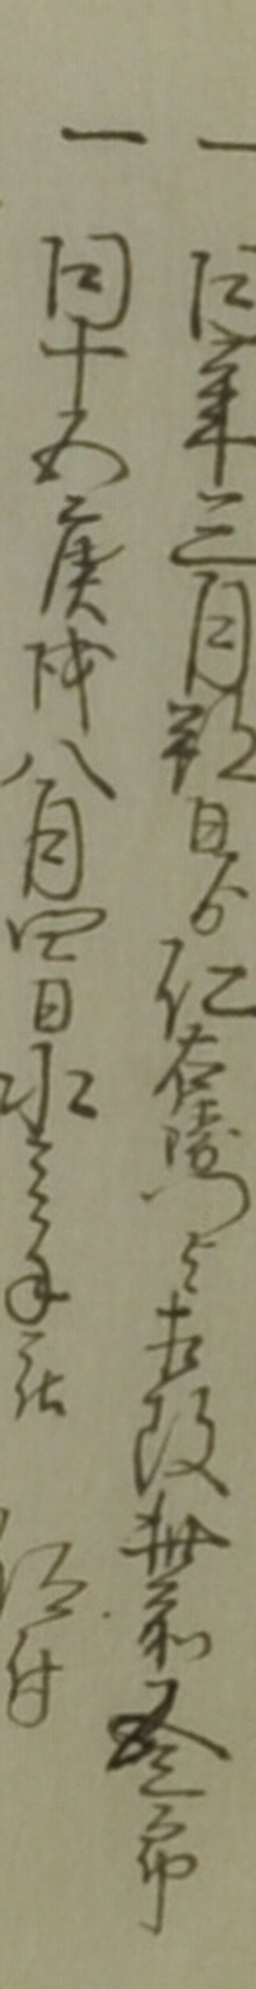一同十五庚戌八月四日水之手被仰付
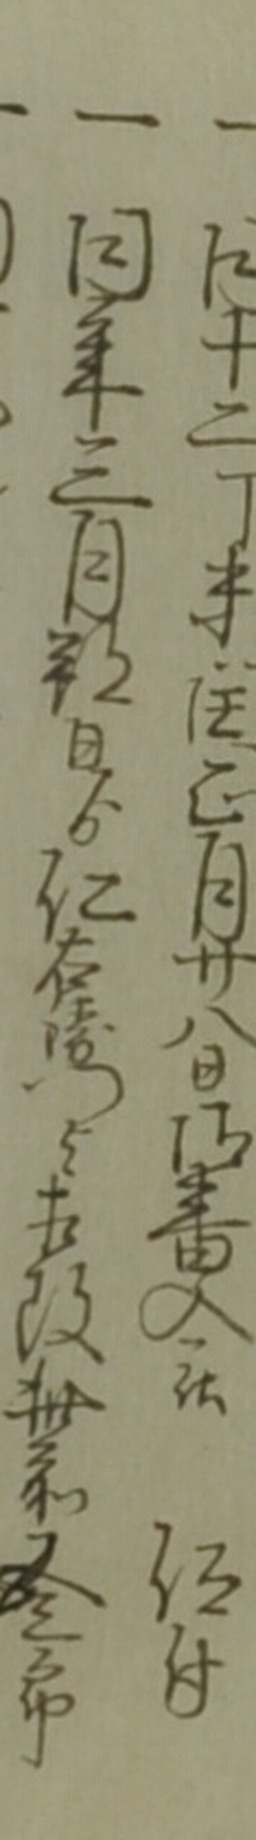一同年三月朔日ゟ仁右衛門与相改此前五三郎
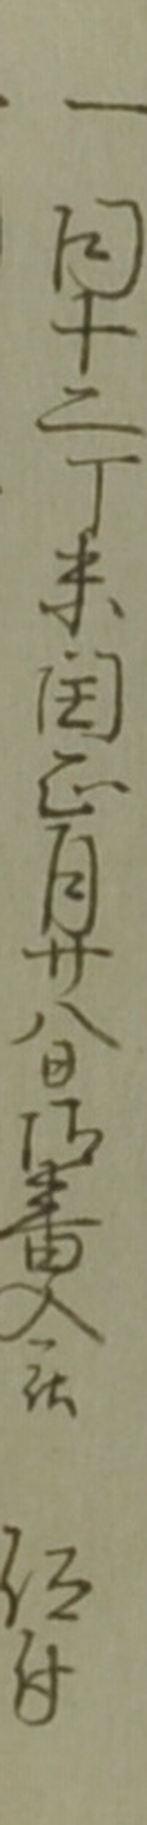一同十二丁未閏正月廿八日御番入被仰付
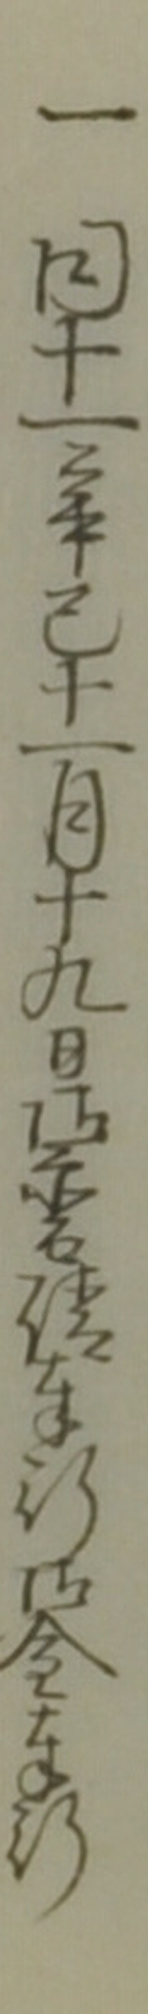一同十一辛己十一月十九日御普御金奉御
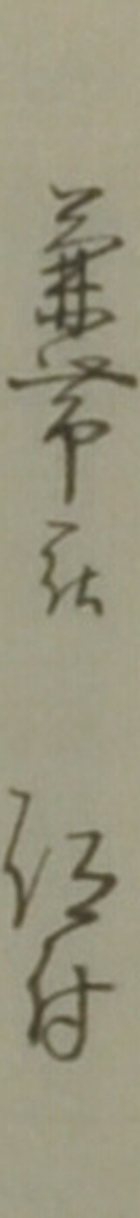兼帯被仰付
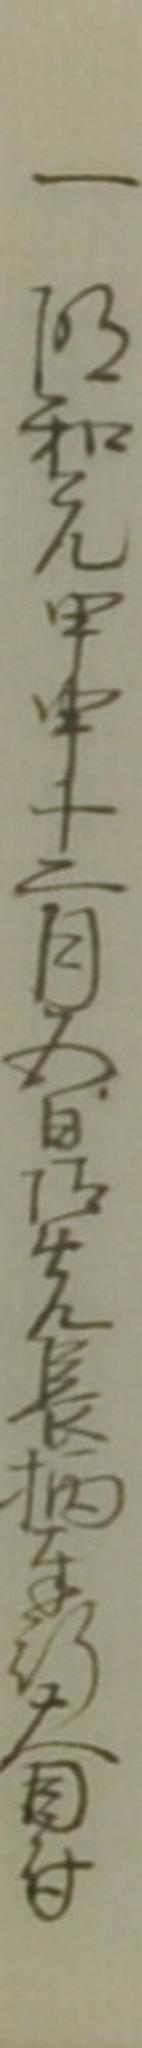一明和元甲申十二月五日御先長柄奉行大目付
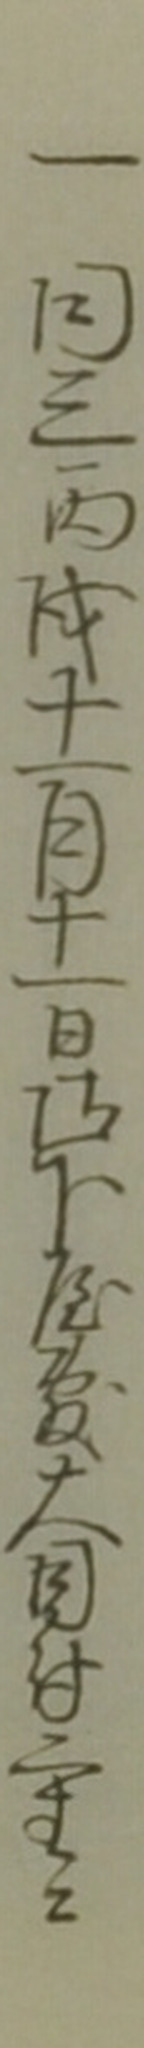一同三丙戊十一月十一日御下屋敷大目付実二
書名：給人諸士勤仕録（三）
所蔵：伊那市立高遠町図書館・合同会社AMANE
